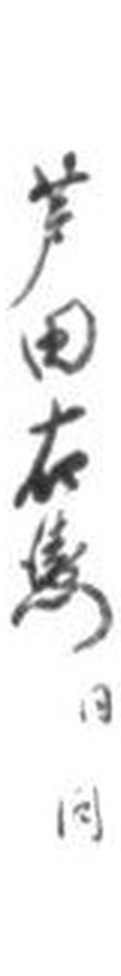芦田右衛門同同
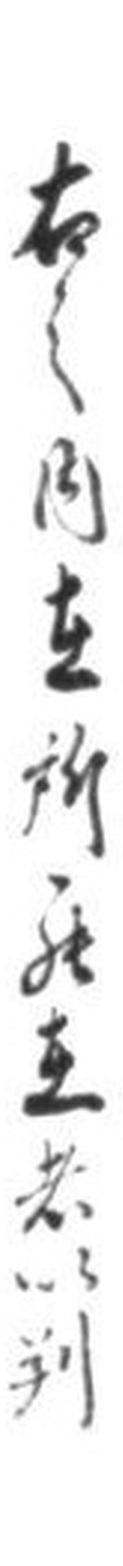右之内在所罷在者以判
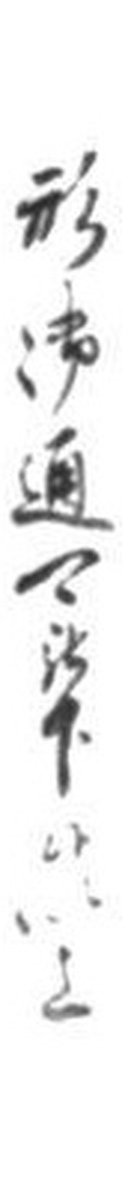形御通可被下候以上
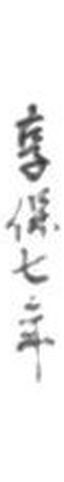享保七年
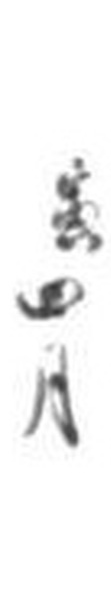寅四月
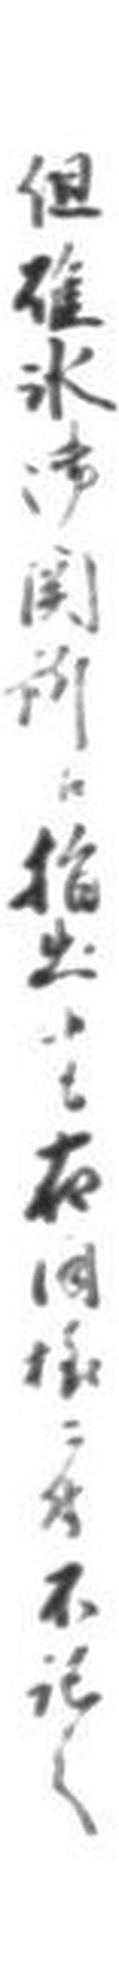但碓氷御関所江指出候も右同様ニ付不記之
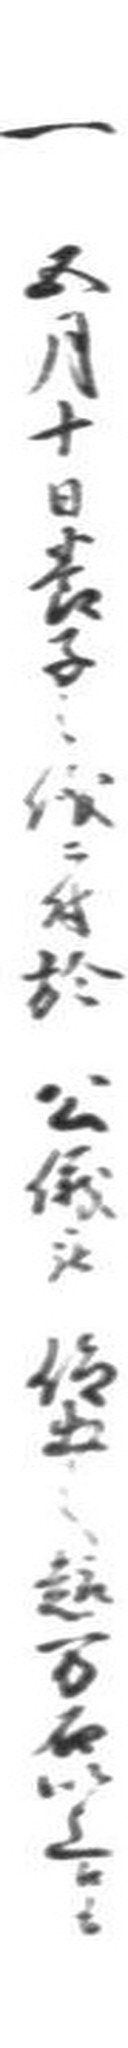一五月十日養子之儀ニ付於公儀被仰出之趣万石以上江も
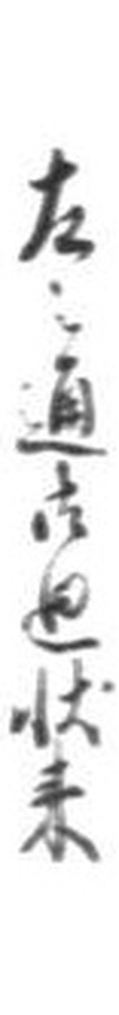左之通御甲廻状来
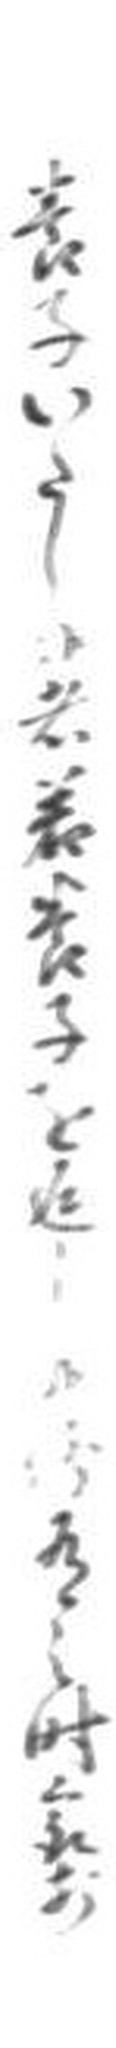養子いたし候者若養子を返し候儀有之時最前
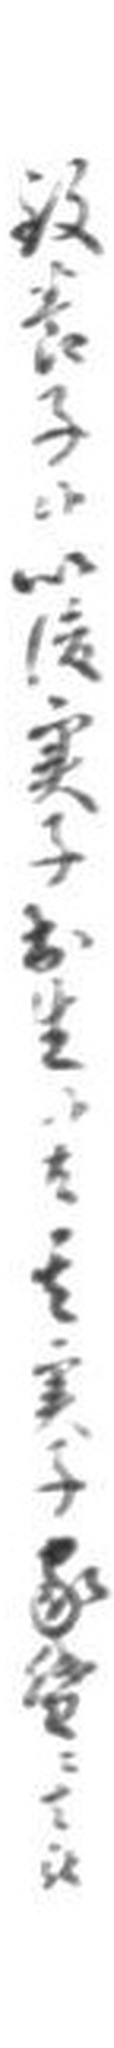致養子候以後実子出生候共其実子家督ニ者被
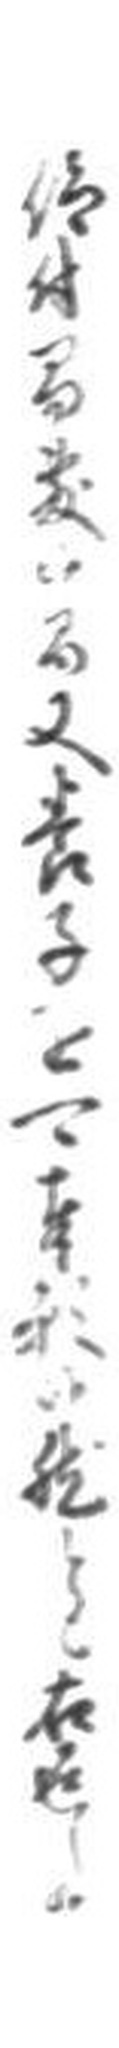仰付間敷候間又養子を可奉願候然とも右返し候
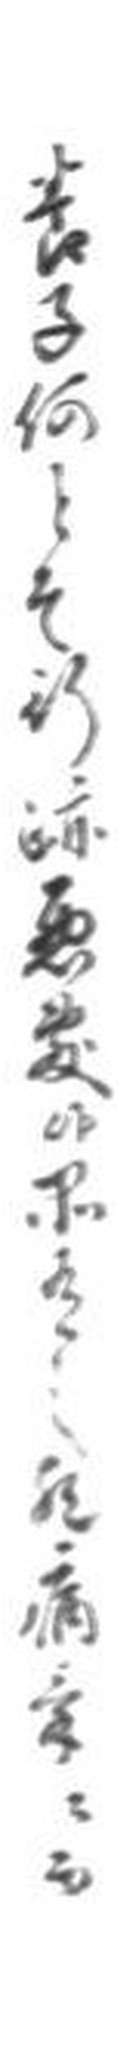養子何ことそ行跡悪敷候品有之歟病気ニ而
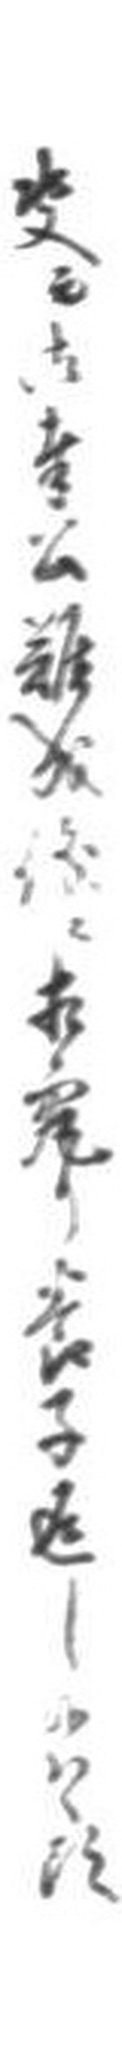決而御奉公難成儀ニ相究り養子返し候ハヽ頭

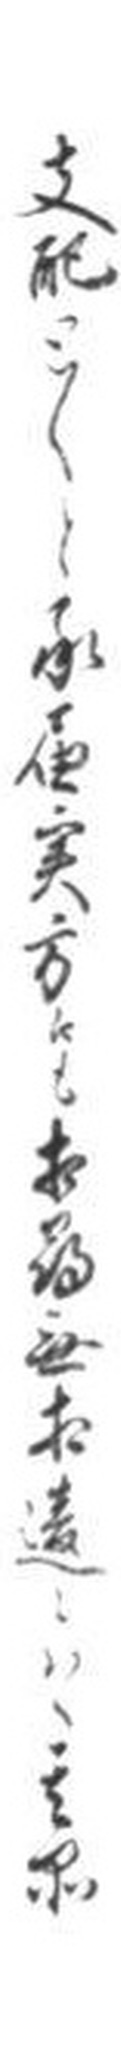支配とくと承届実方江も相尋無相違候ハヽ其品
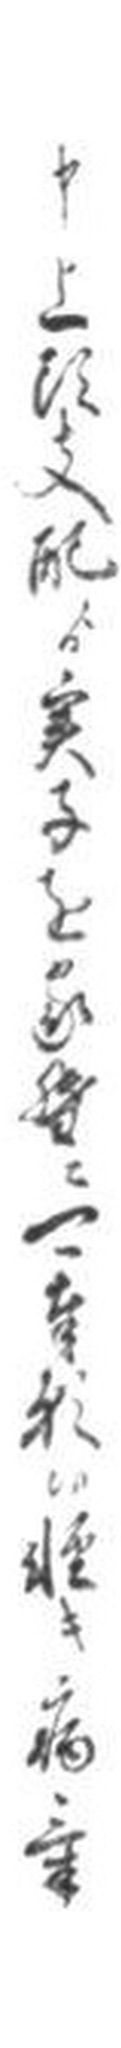申上頭支配ゟ実子を家督ニ可奉願候軽キ病気
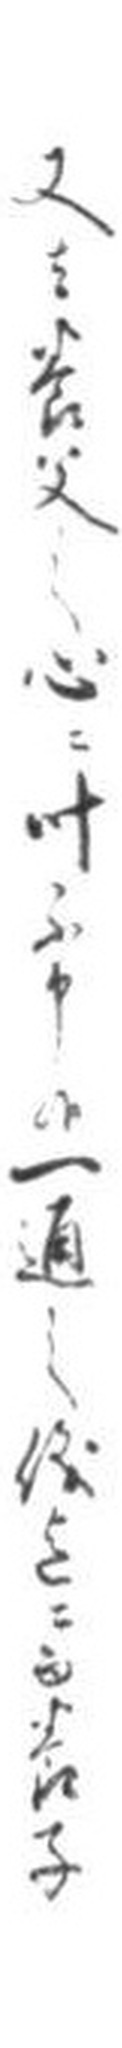又者養父之心ニ叶不申候一通之儀迄ニ而養子
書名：家譜 三十五 宗昌公 従享保六年到同七年
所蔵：福井県文書館 Fukui Prefectural Archives
